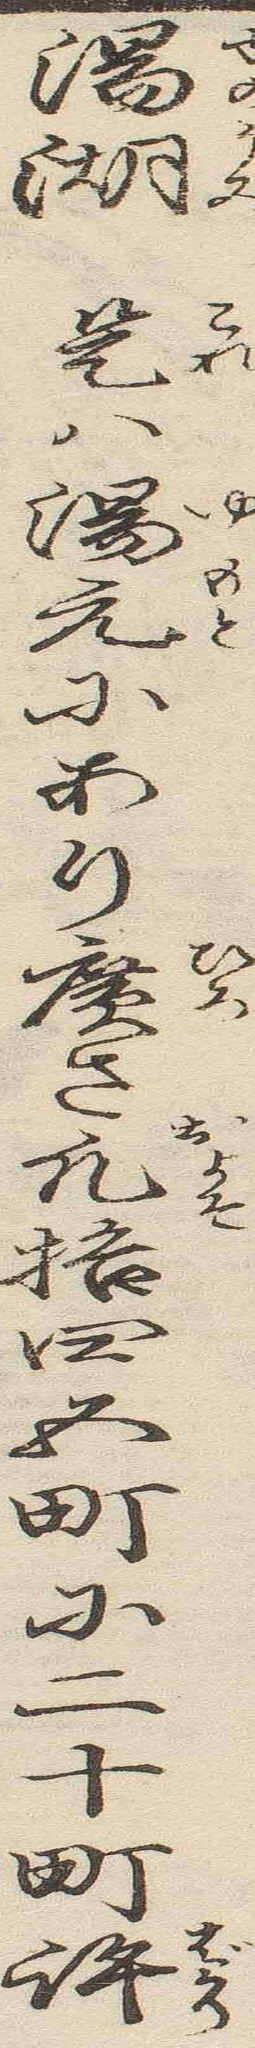湯湖是は湯元にあり廣さ凢拾四五町に二十町許
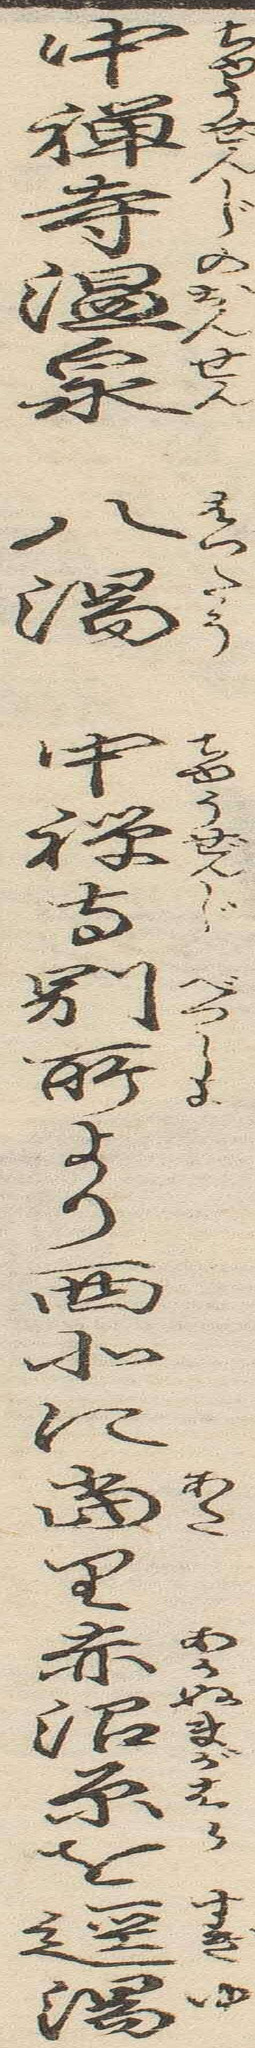中禅寺温泉八湯中禅寺別所より西北に當り赤沼原を逕湯
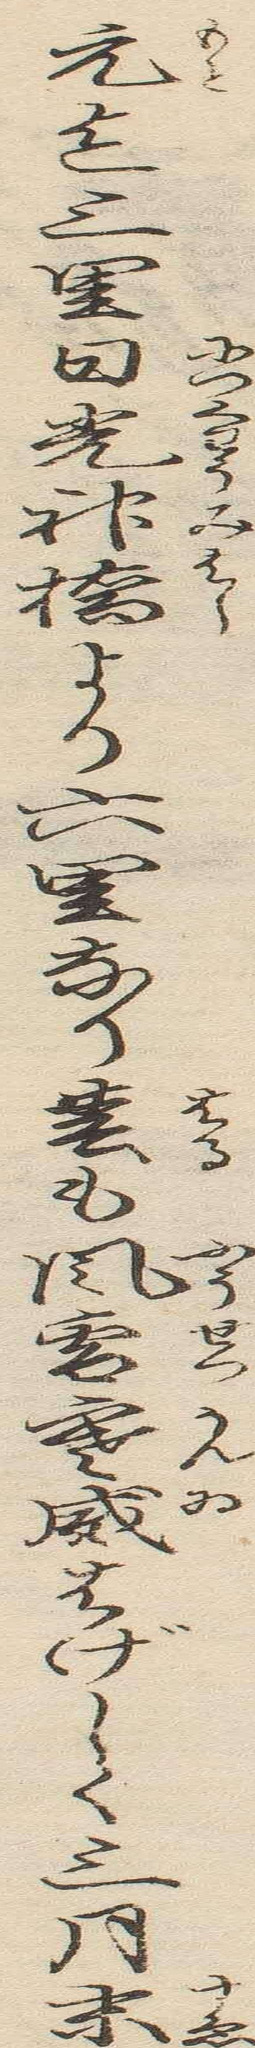元迄三里日光神橋より六里あり春も風雪寒威はげしく三月末
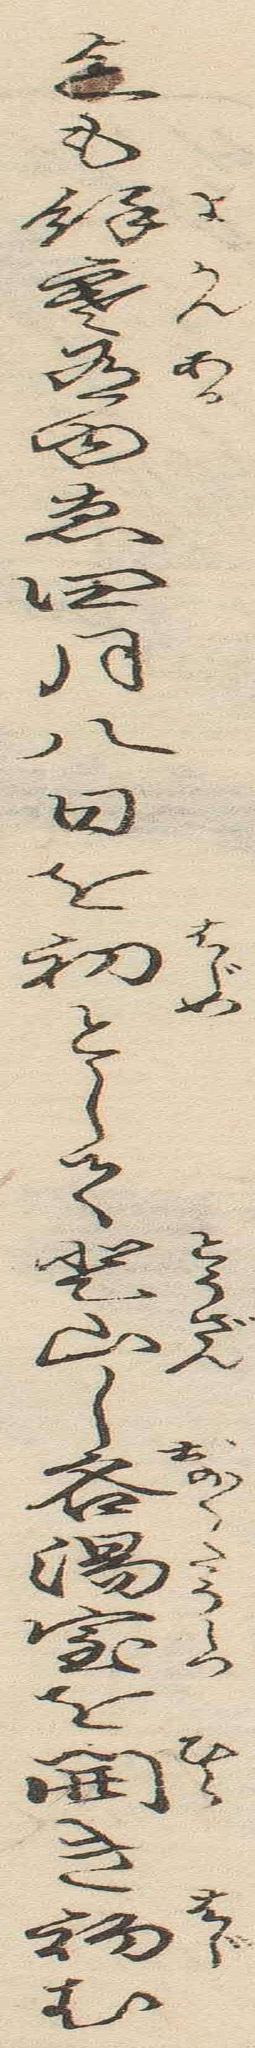迄も餘寒有ゆゑ四月八日を初として登山し各湯室を開き初む
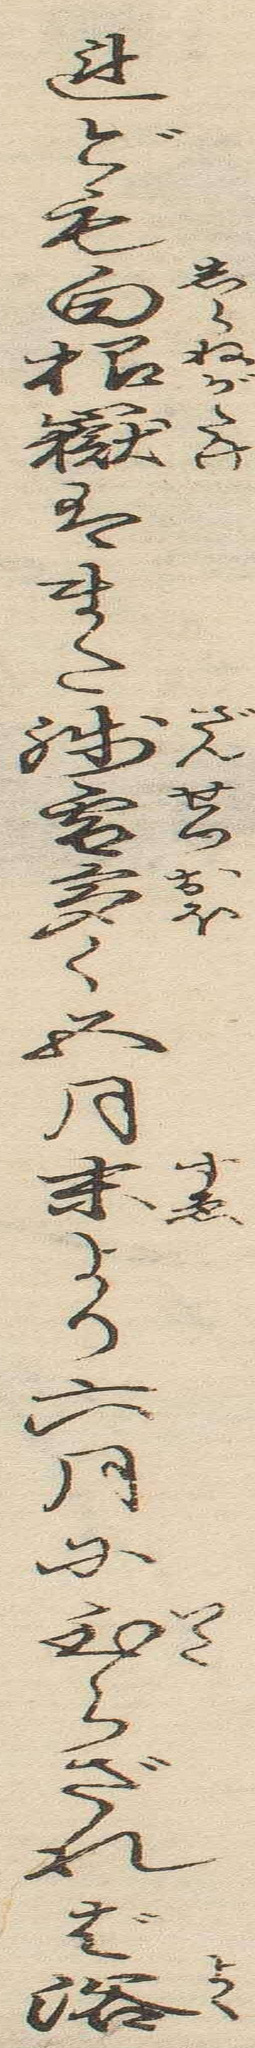れども白根嶽はまた残雪多く五月末より六月に至らざれば浴
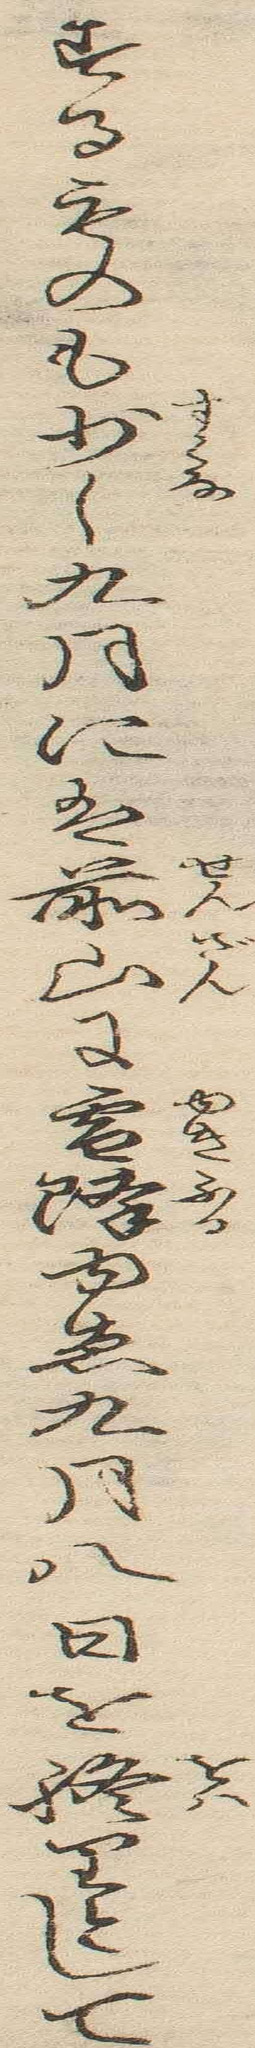するものも少し九月には前山に雪降ゆゑ九月八日を終りとして
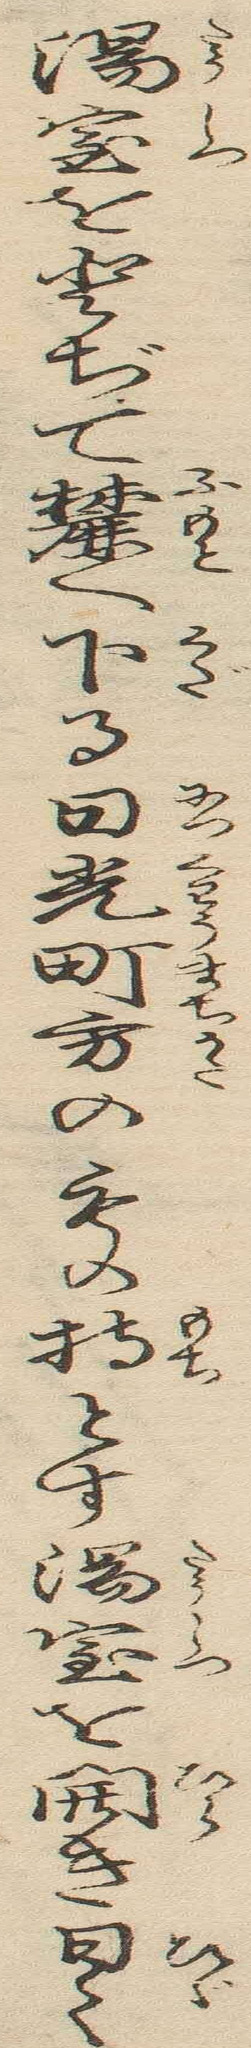湯室をとぢて麓へ下る日光町方のもの持とす湯室を開き日〻

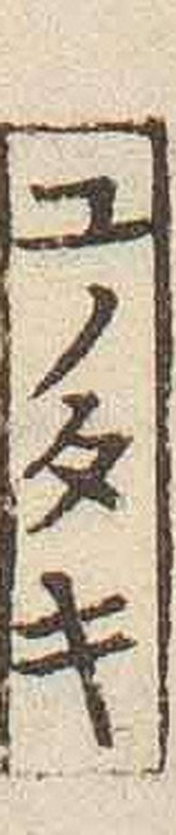ユノタキ
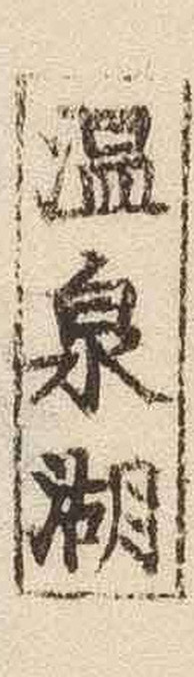温泉湖

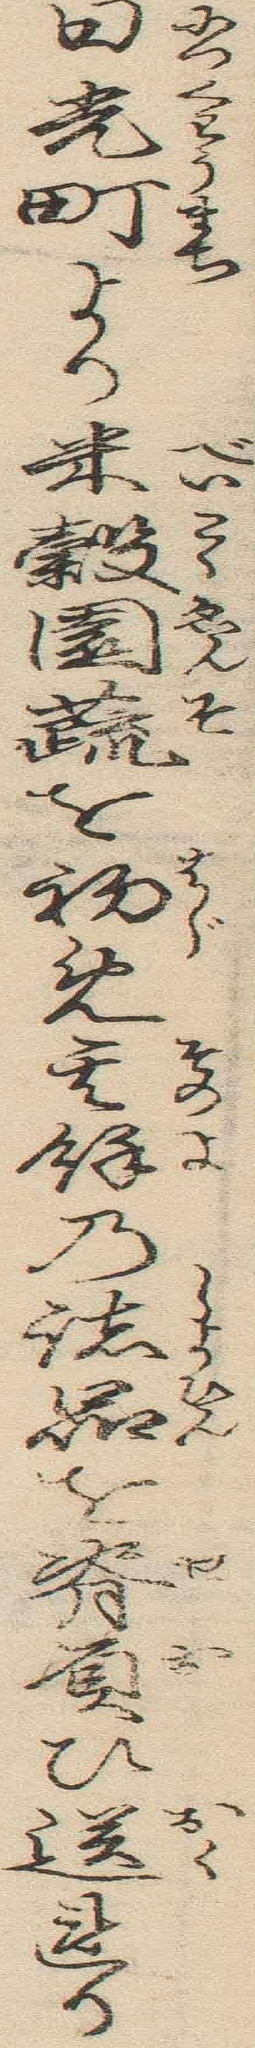日光町より米穀園蔬を初め其餘の諸品を脊負ひ送れり
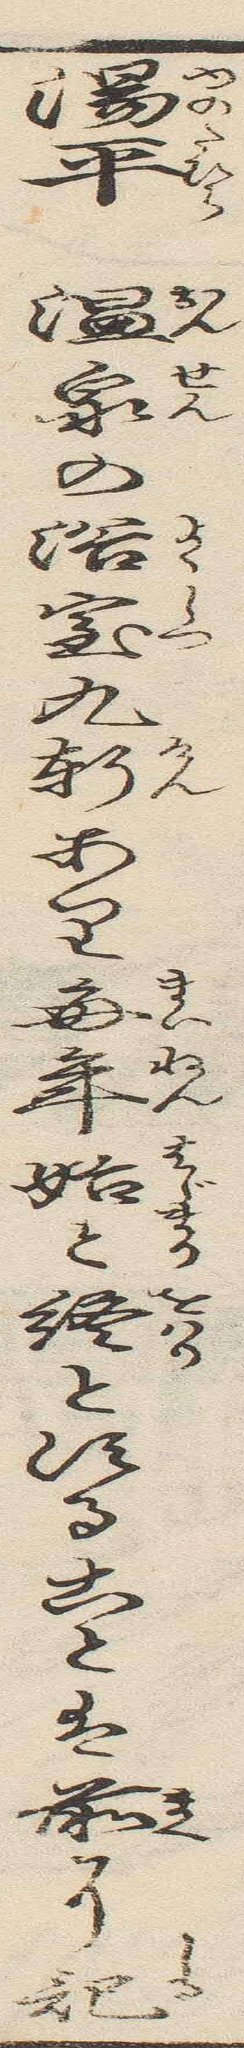湯平温泉の浴室九軒あり毎年始と終とすることは前に記
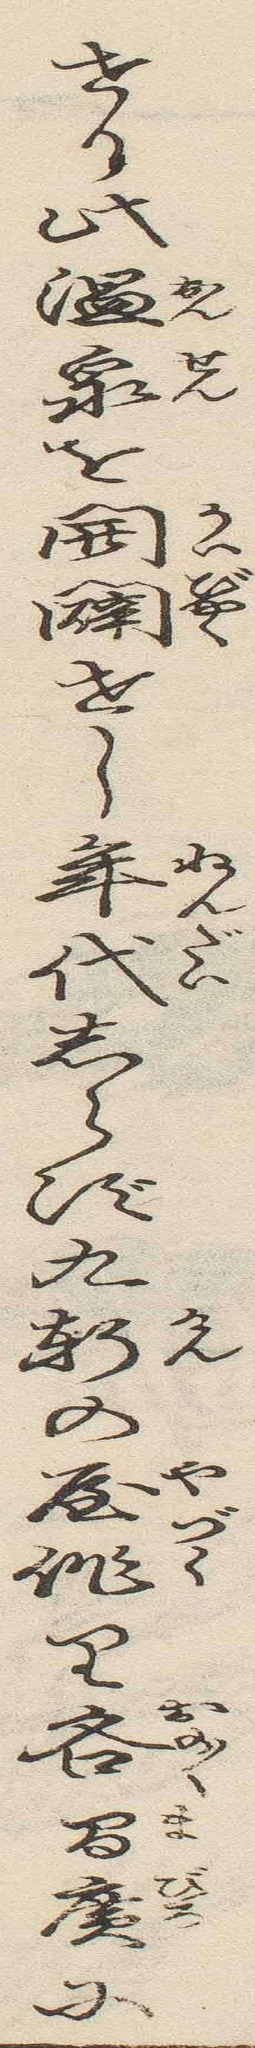せり此温泉を開闢せし年代しらず九軒の屋作り各間廣に
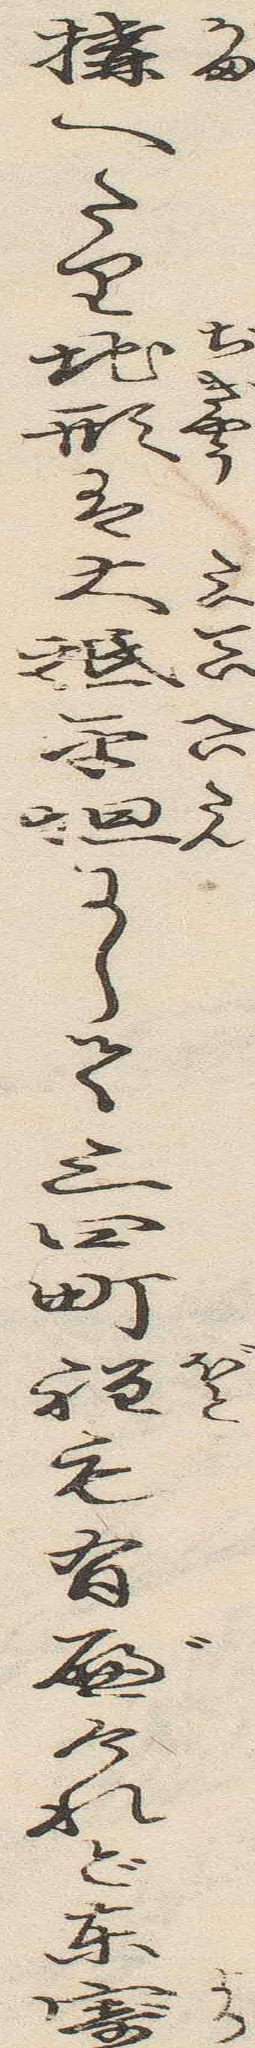構へたり地形は大抵平坦にして三四町程も有べけれど東寄
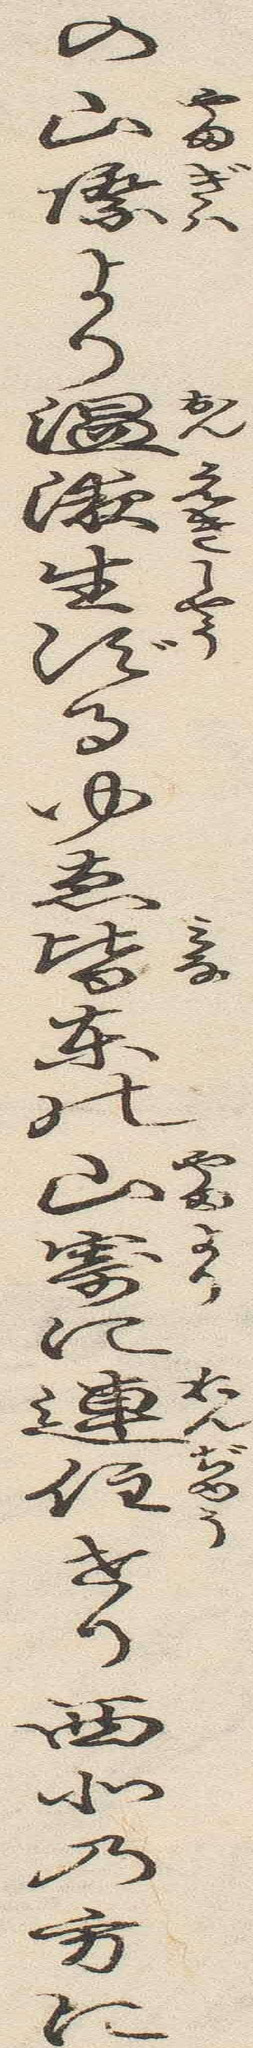の山際より温液生ずるゆゑ皆東の山寄に連住せり西北の方に
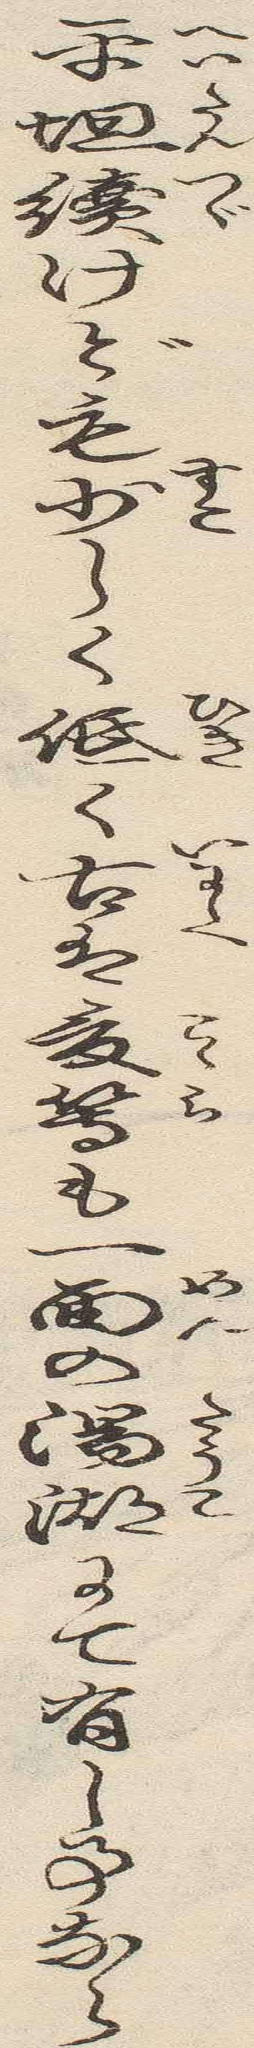平坦續けども少しく低く古は爰等も一面の湯湖にて有し事なら
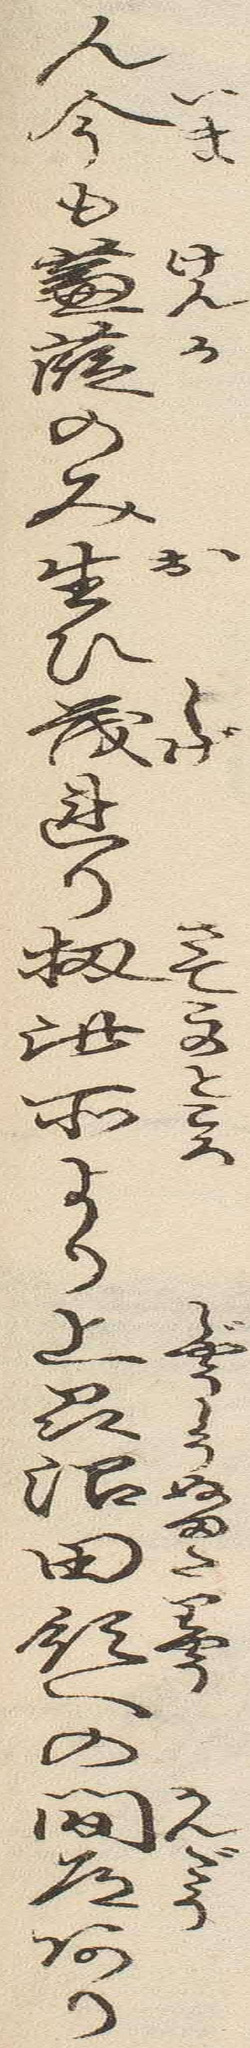ん今も蒹葭のみ生ひ茂れり扨此所より上刕沼田領への間道あり
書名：日光山志
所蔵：東京学芸大学附属図書館 国文学研究資料館
